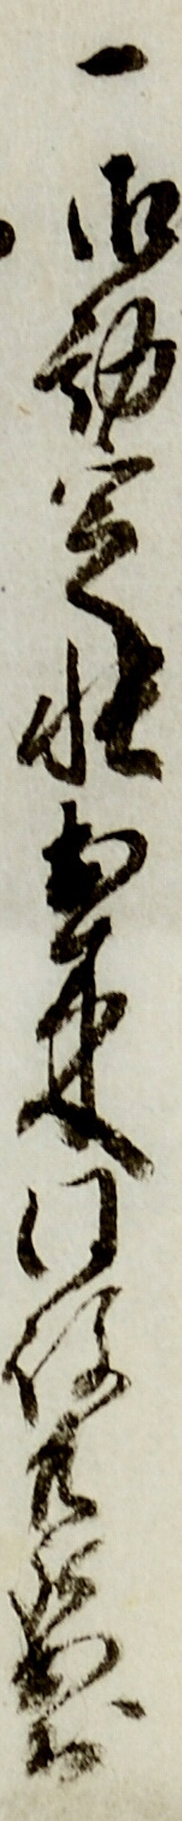一御勘定帳出来同役共罷出於
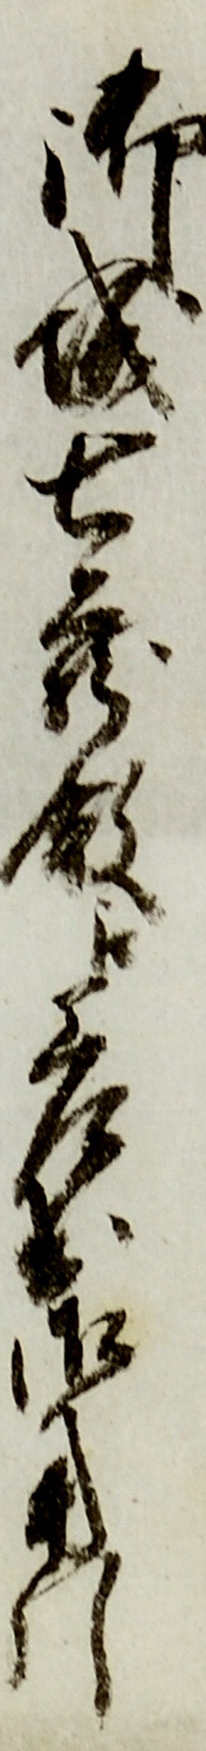御城七蔵殿え差出御用引
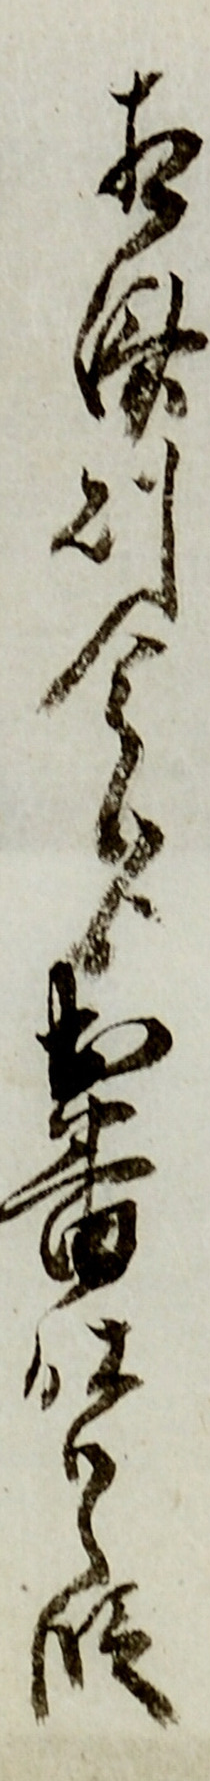相済則今日より出番仕候段
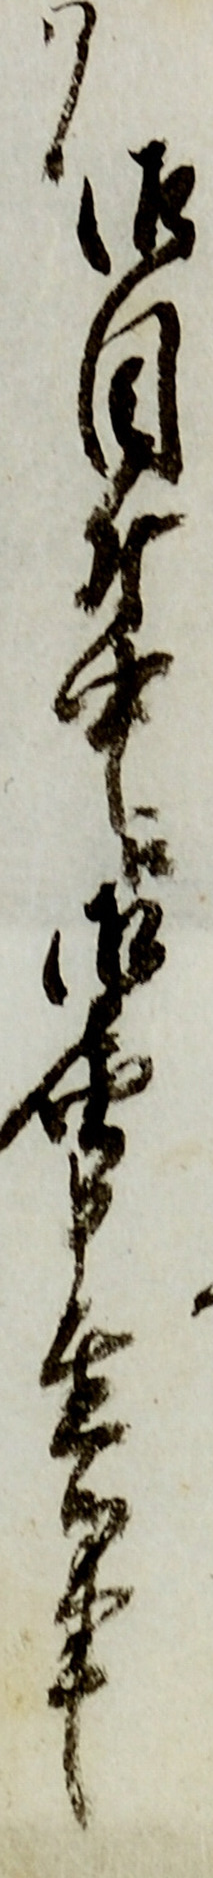御目付中え御届申置候事
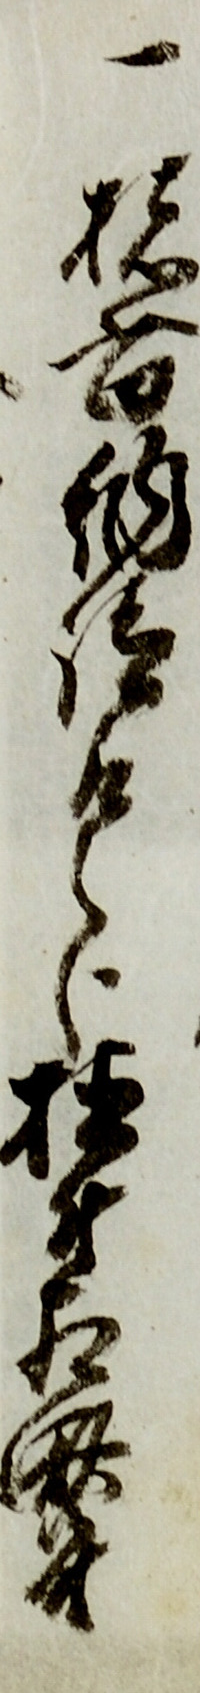一楮苗納請取之分植付相済候付
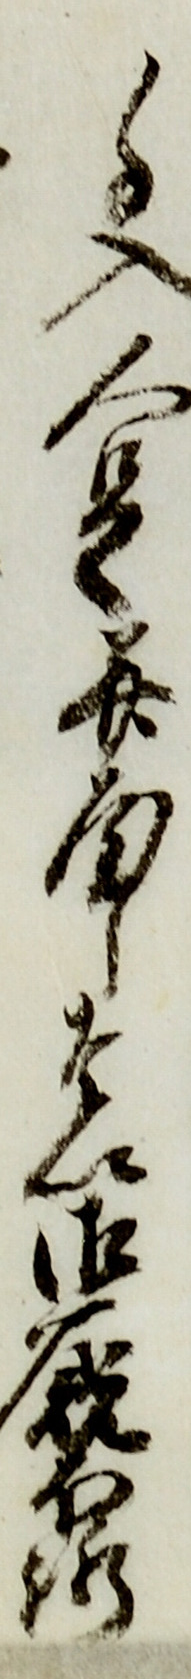手入人足并やしない御厩ほろ
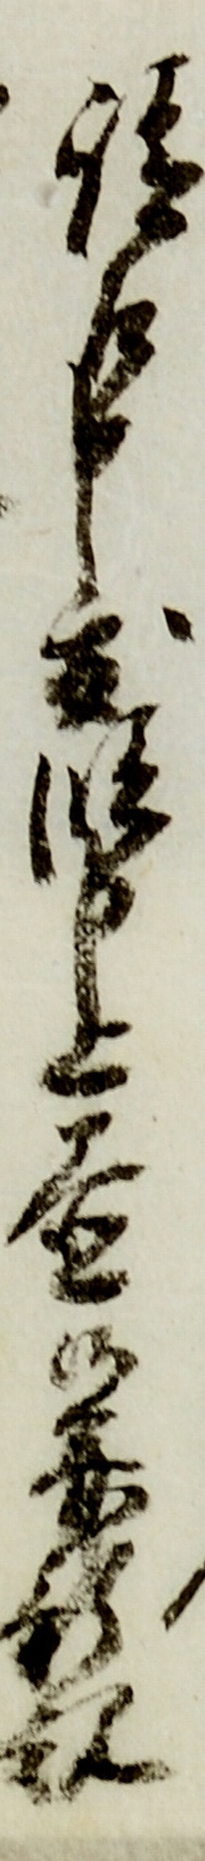請取申度段申上置候并新規
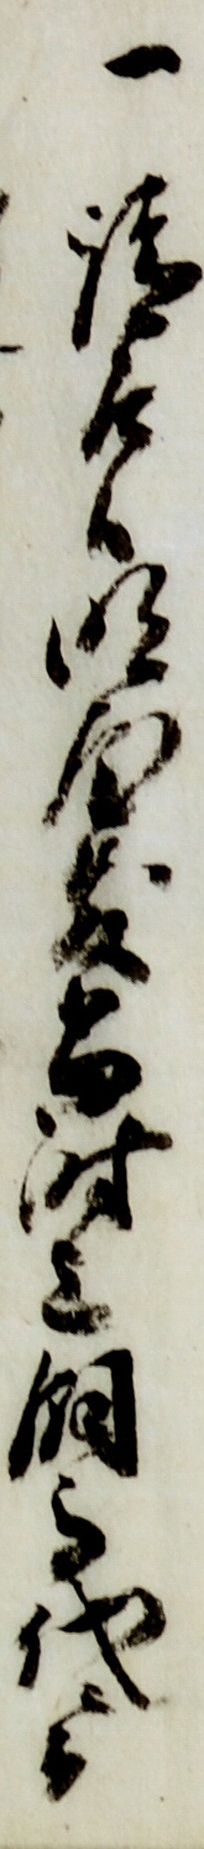一清左衛門明屋敷当時迄飼馬代にて
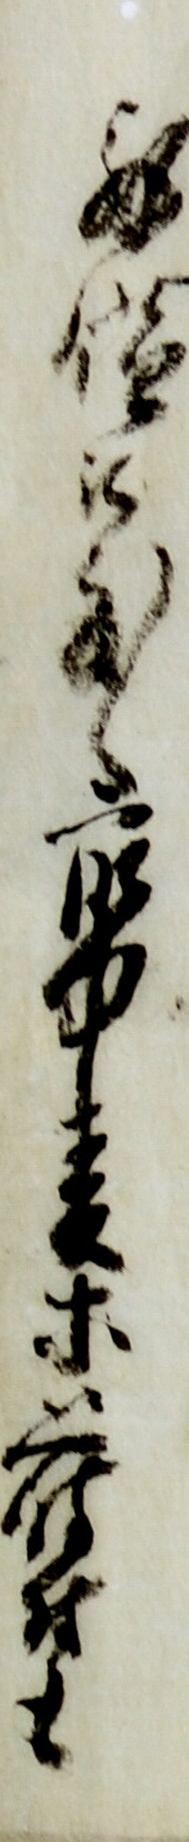拝借被成候畝中麦等蒔付も

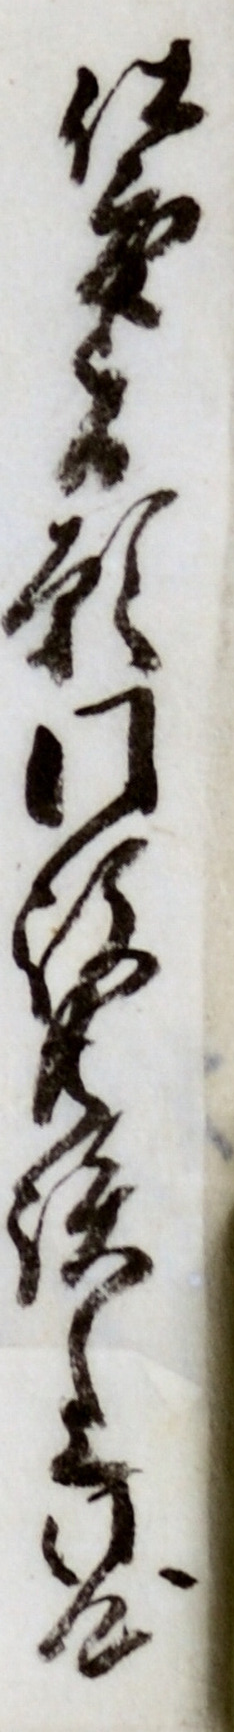仕度旨願同役共談之上同心
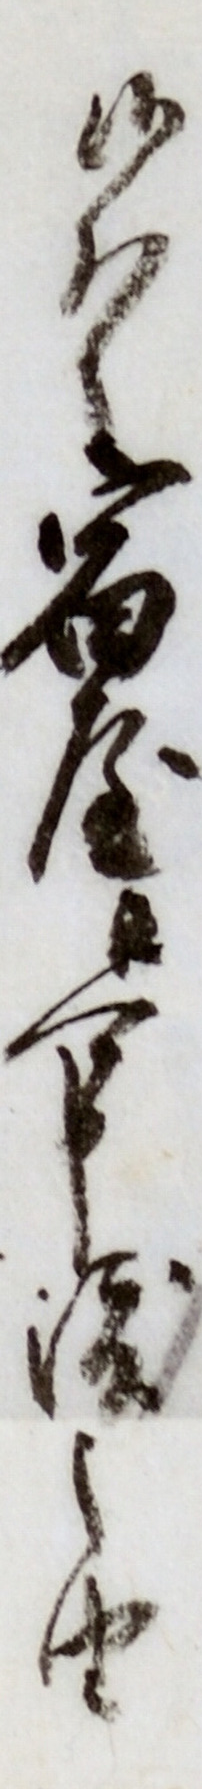候ははゝ宿屋え可渡之由
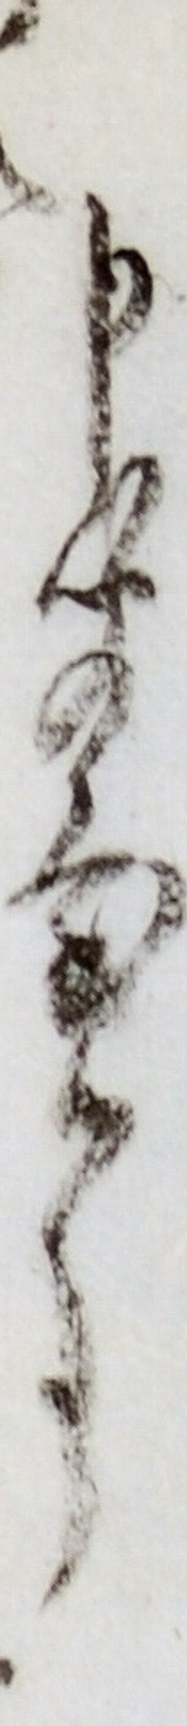申聞置候事
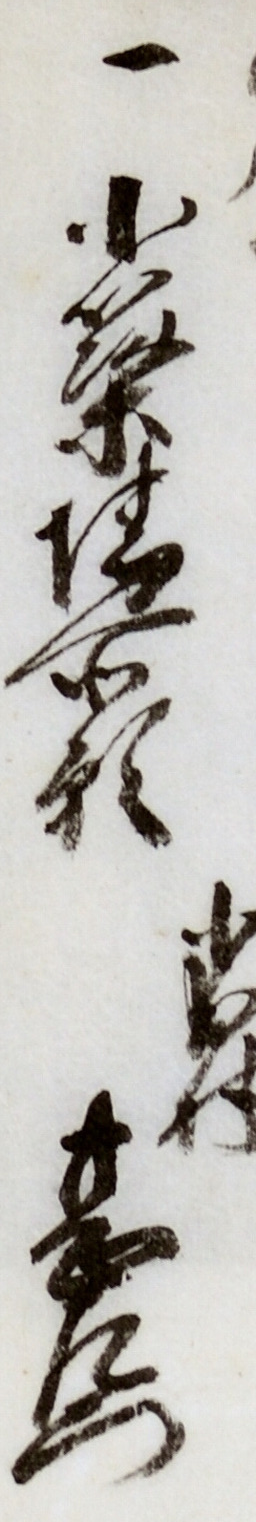一小簗場所願甚左衛門
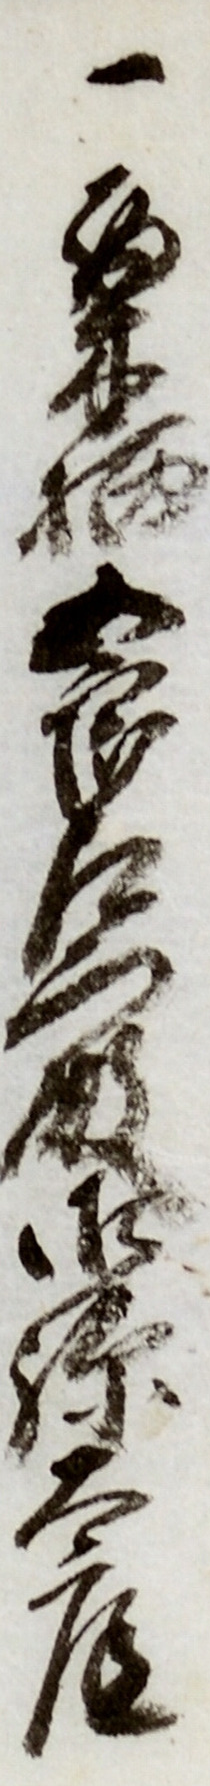一栗柄五郎左衛門殿御孫大庭
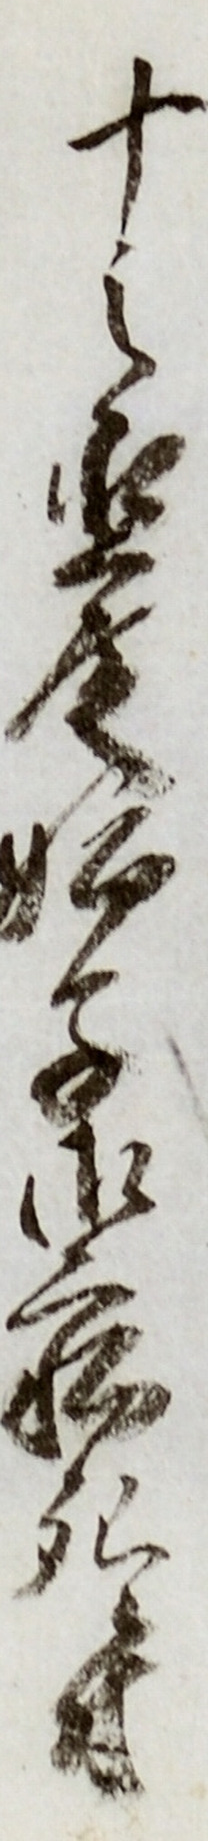十之丞殿姉子御病死に付
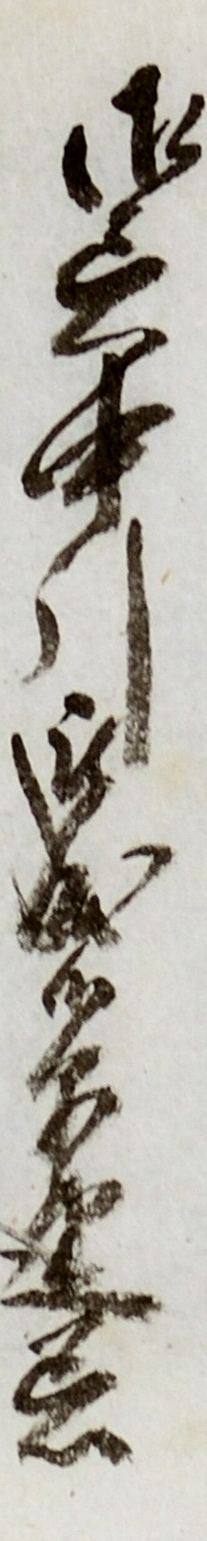御忌中引被成候早速忌
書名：諸事御用留帳
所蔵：伊那市立高遠町図書館・合同会社AMANE
